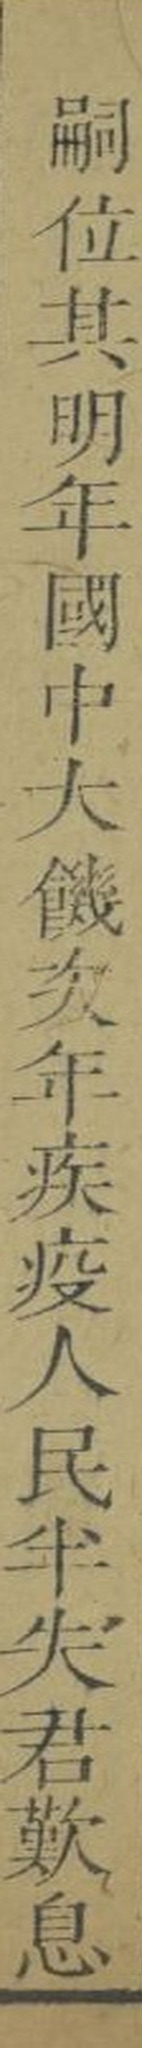嗣位其明年国中大饑次年疾疫人民半失君歎息
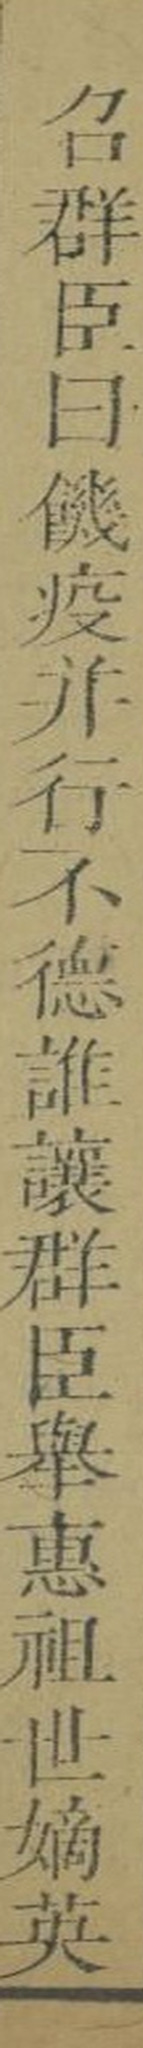召群臣曰饑疫并行不徳誰譲群臣挙恵祖世嫡英
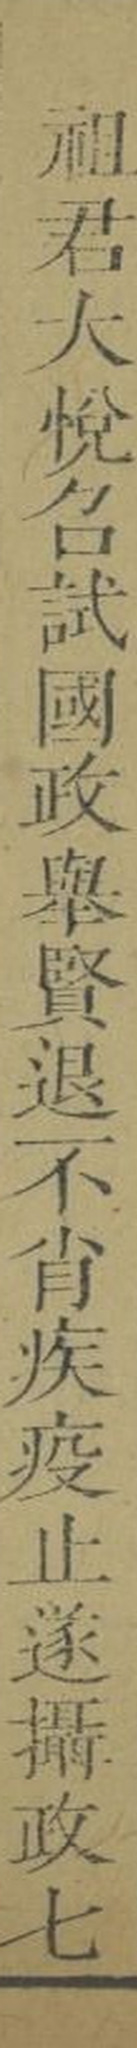祖君大悦召試国政挙賢退不肖疾疫止遂摂政七
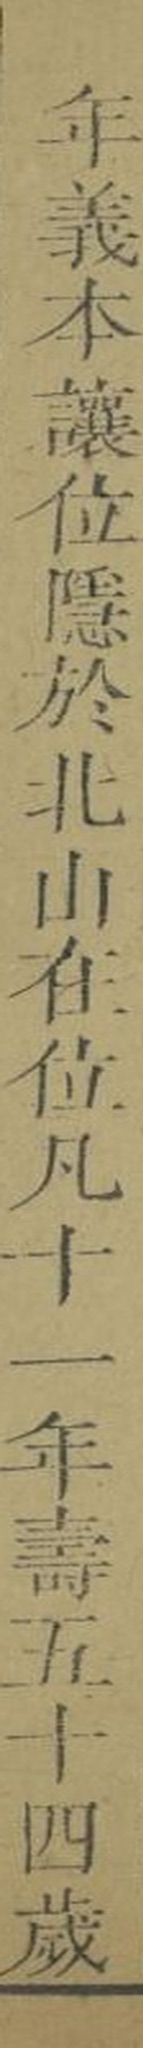年義本譲位隠於北山在位凡十一年寿五十四歳
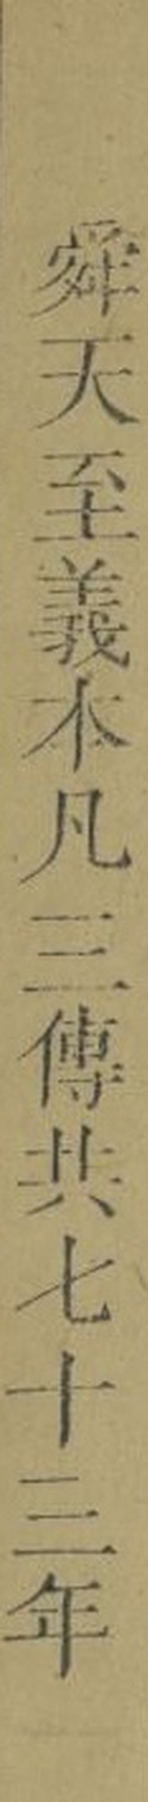舜天至義本凡三伝共七十三年

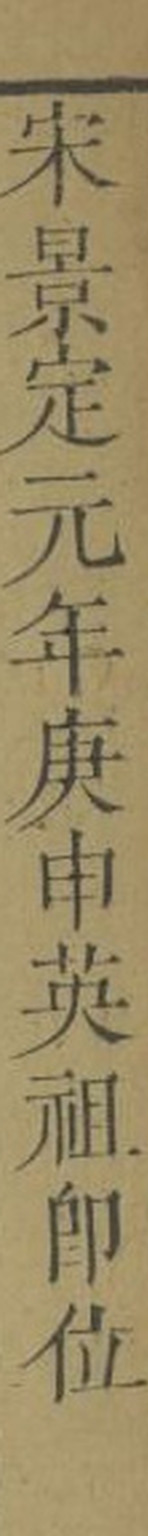宋景定元年庚申英祖即位
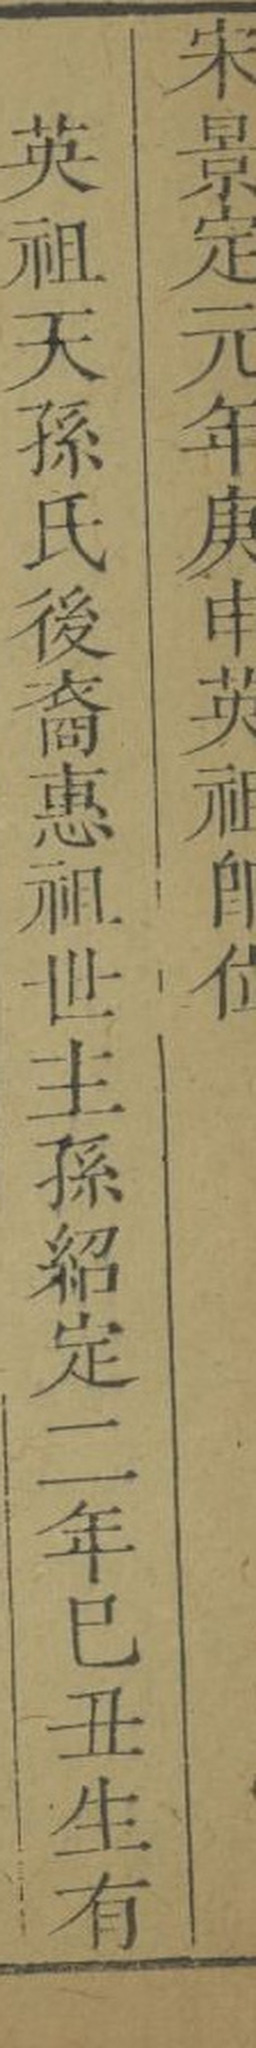英祖天孫氏後裔恵祖世主孫紹定二年巳丑生有
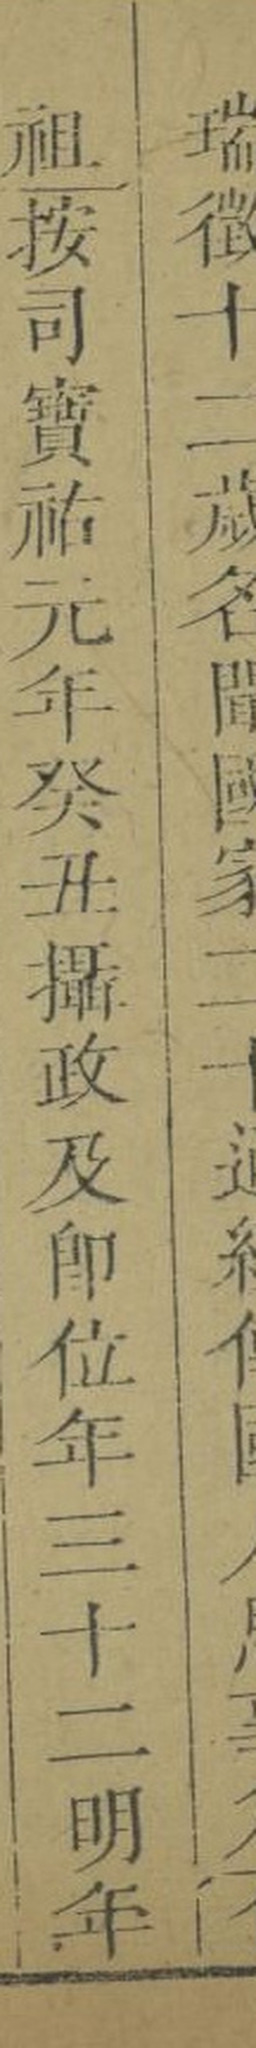祖]按司宝祐元年癸丑摂政及即位年三十二明年
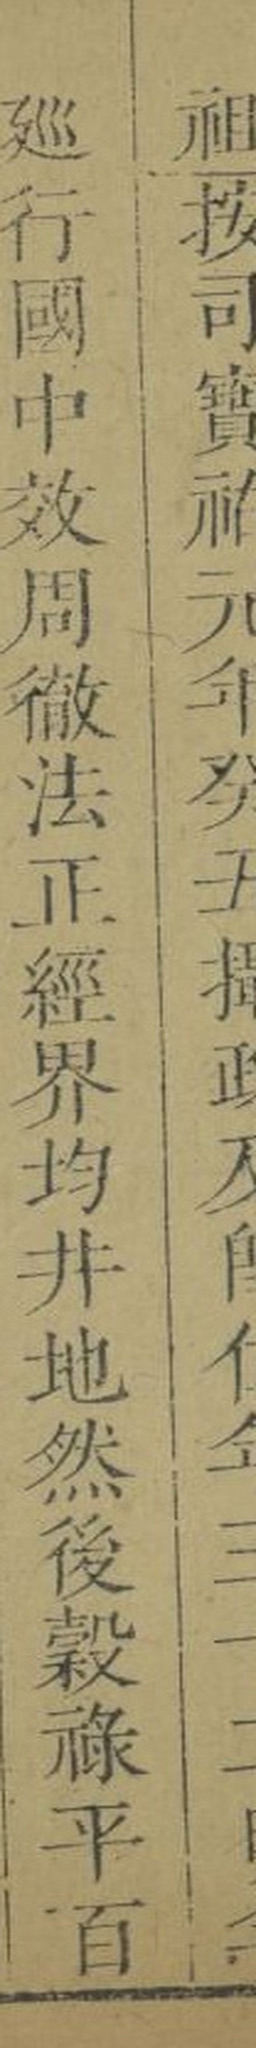巡行国中效周徹法正経界均井地然後穀禄平百
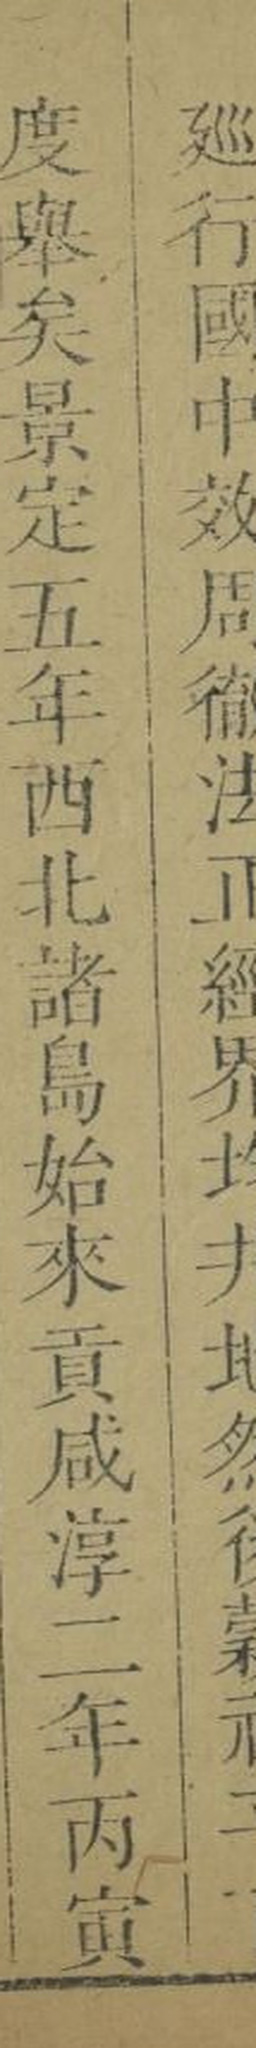度挙矣景定五年西北諸島始来貢咸淳二年丙寅
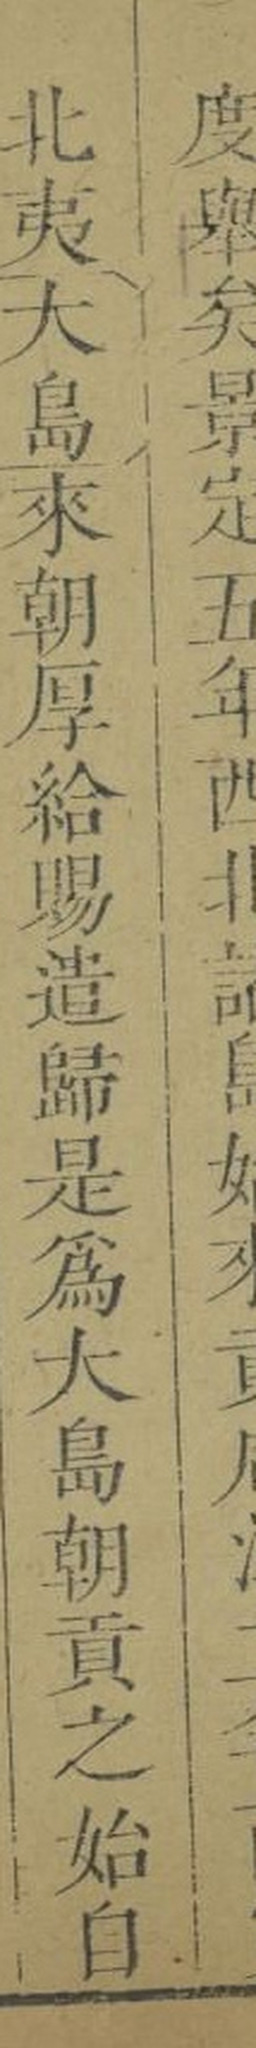北夷[大島]来朝厚給賜遣帰是為大島朝貢之始自
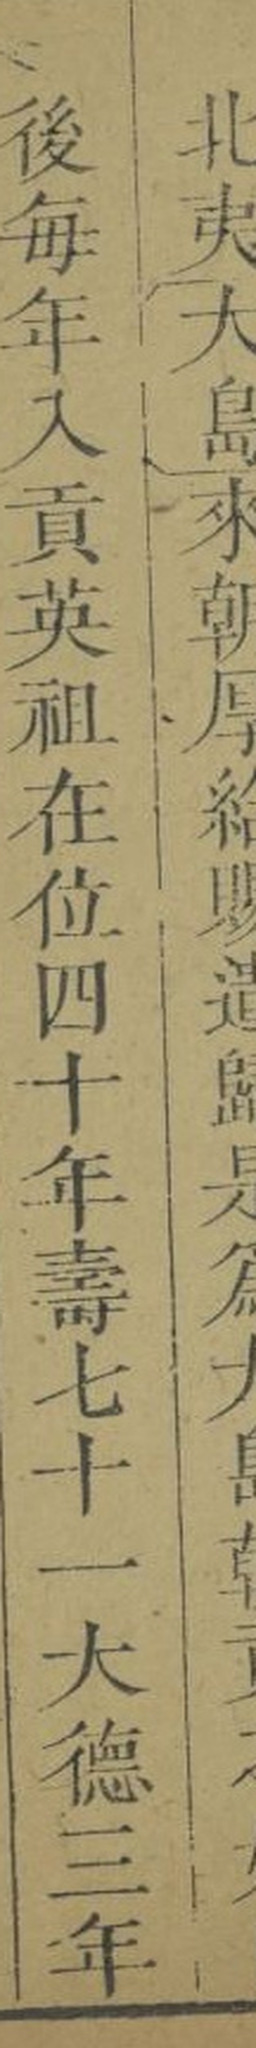後毎年入貢英祖在位四十年寿七十一大徳三年
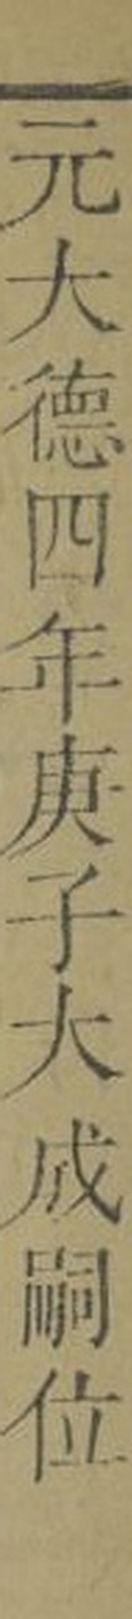元大徳四年庚子大成嗣位
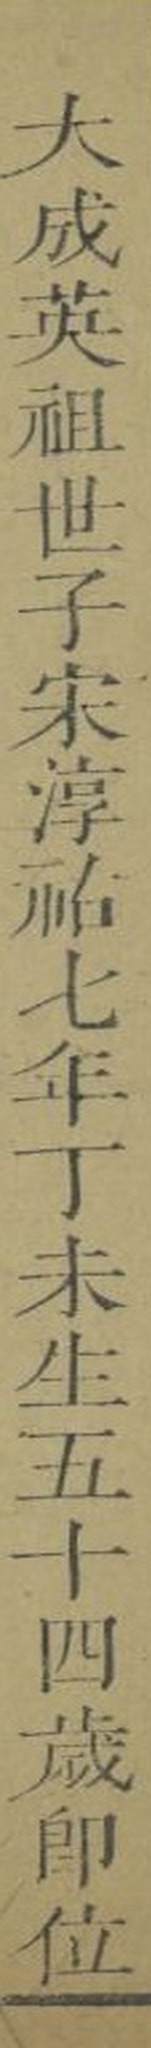大成英祖世子宋淳祐七年丁未生五十四歳即位
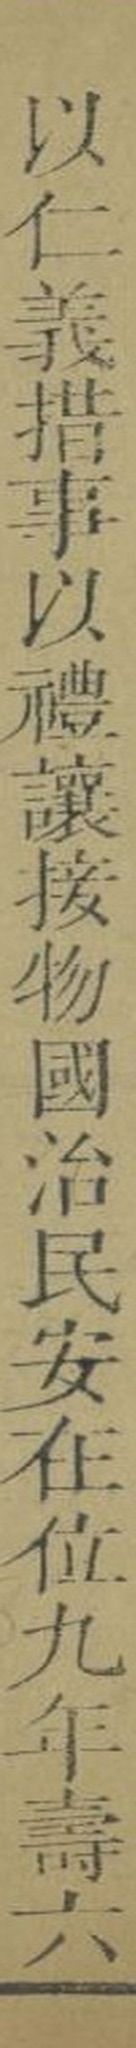以仁義措事以礼譲接物国治民安在位九年寿六
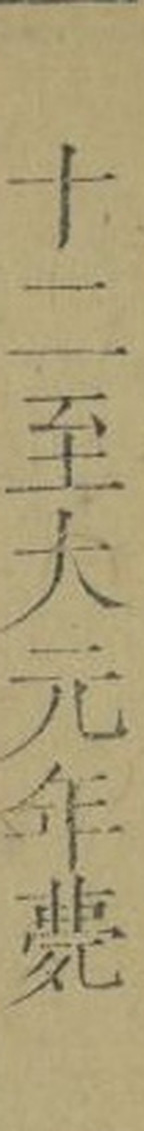十二年至大元年薨
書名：中山伝信録 巻三
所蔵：University of the Ryukyus Library
